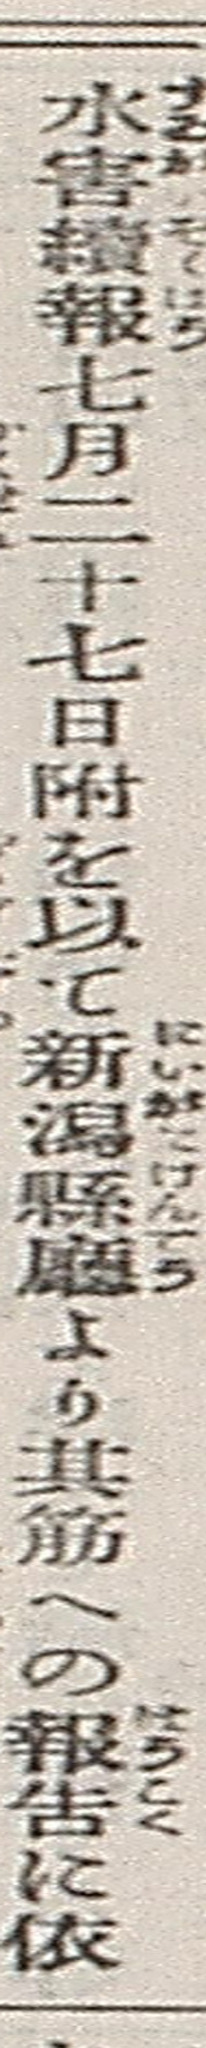水害続報七月二十七日附を以て新潟県庁より其筋への報告に依
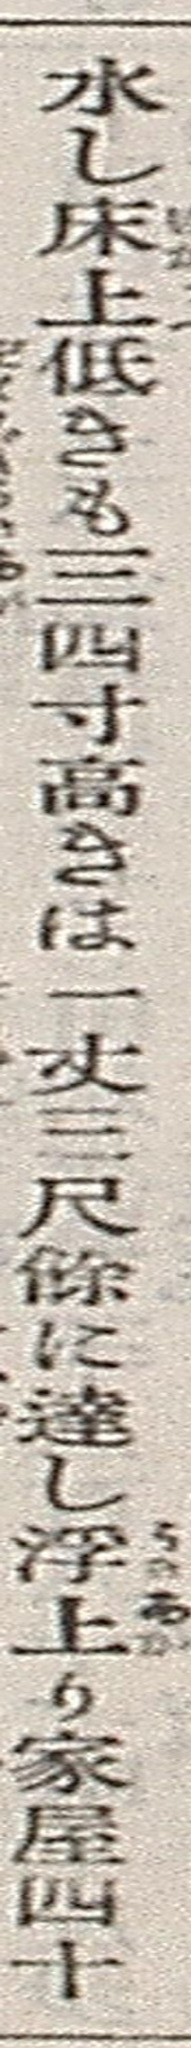水し床上低きも三四寸高きは一丈三尺餘に達し浮上り家屋四十
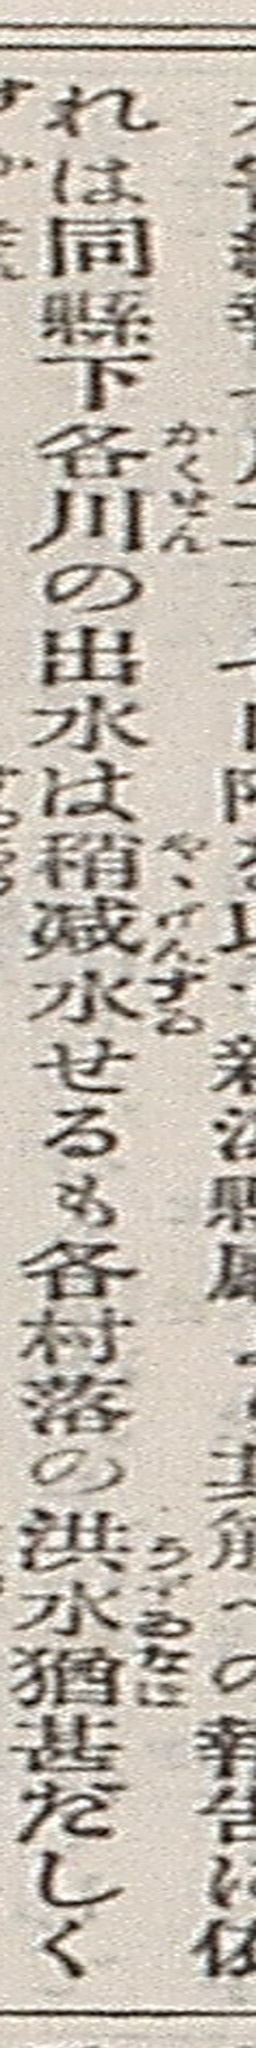れは同県下各川の出水は稍減水せるも各村落の洪水猶甚だしく
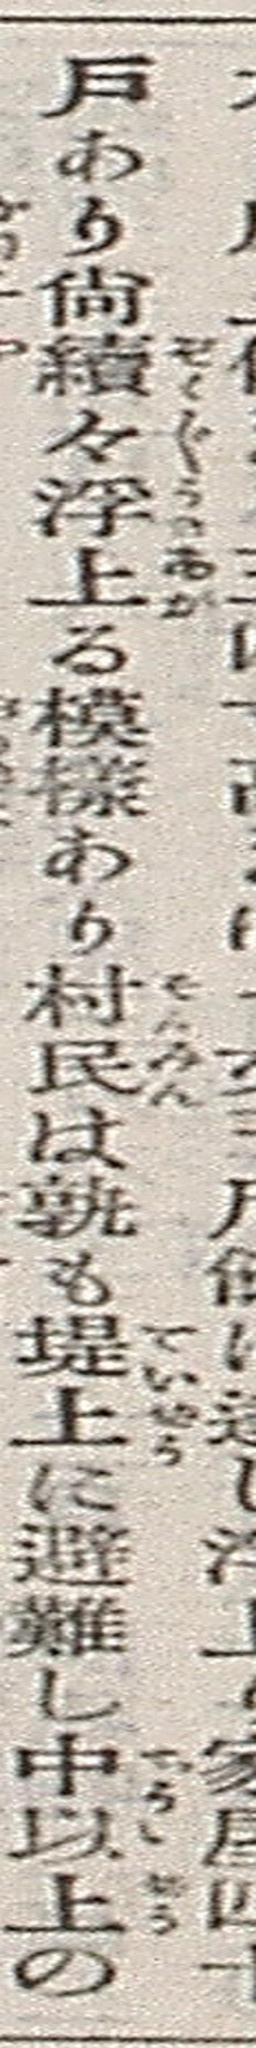戸あり尚続々浮上る模様あり村民は孰も堤上に避難し中以上の
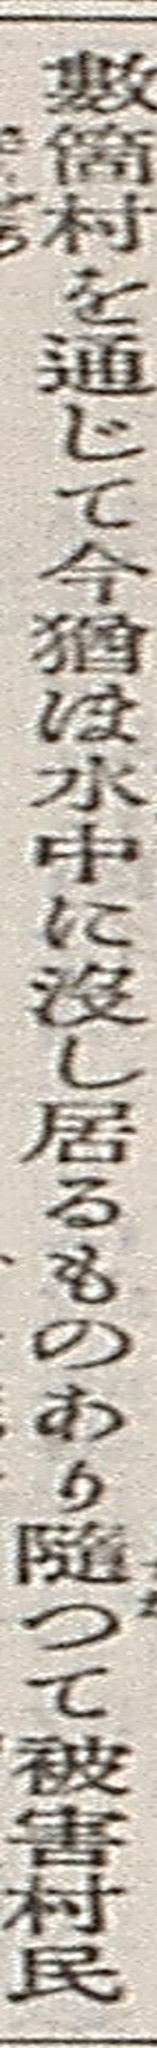数箇村を通じて今猶ほ水中に没し居るものあり随つて被害村民
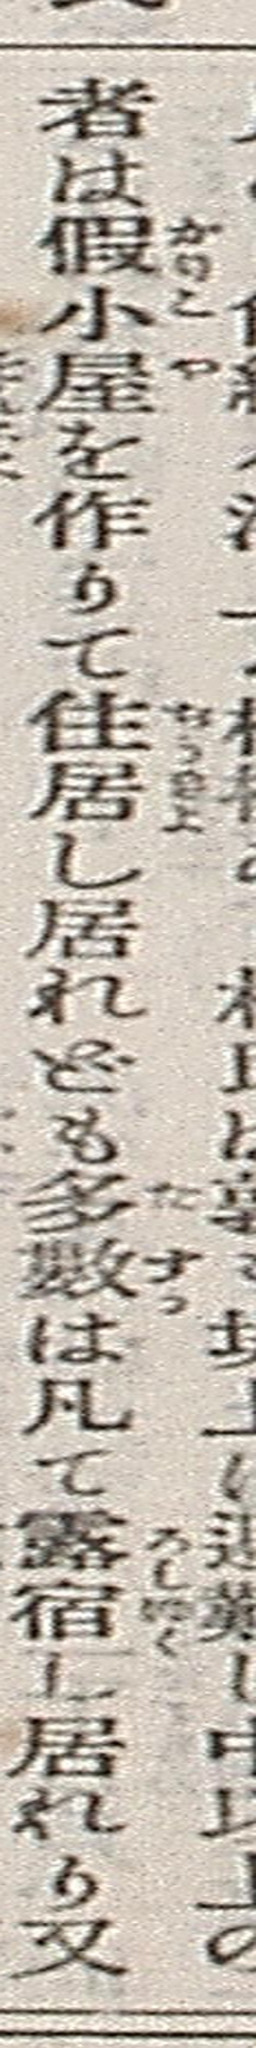者は假小屋を作りて住居し居れども多数は凡て露宿し居れり又
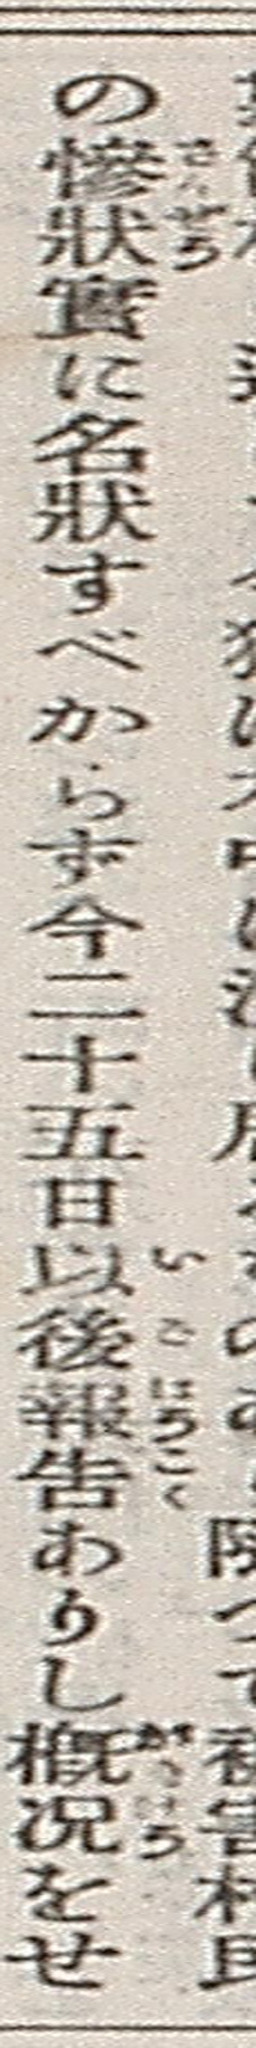の惨状実に名状すべからず今二十五日以後報告ありし概況をせ
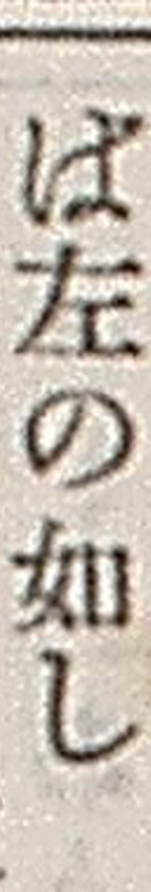ば左の如し
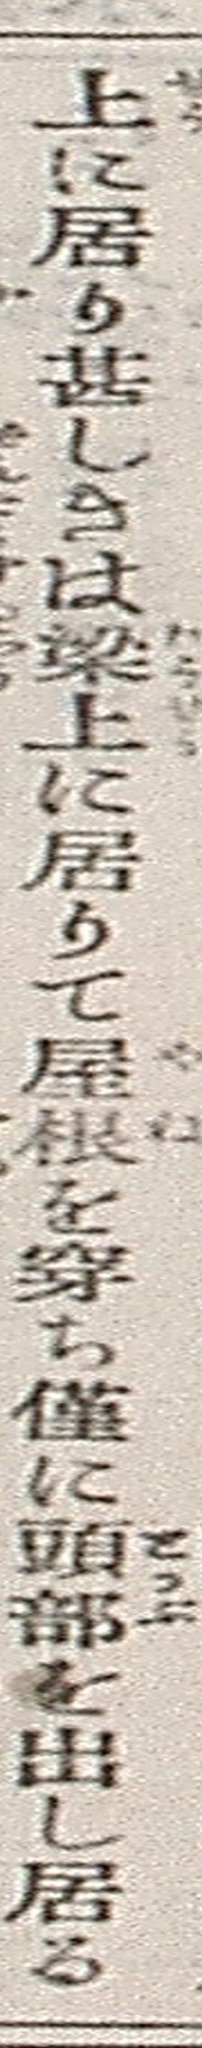上に居り甚しきは梁上に居りて屋根を穿ち僅に頭部を出し居る
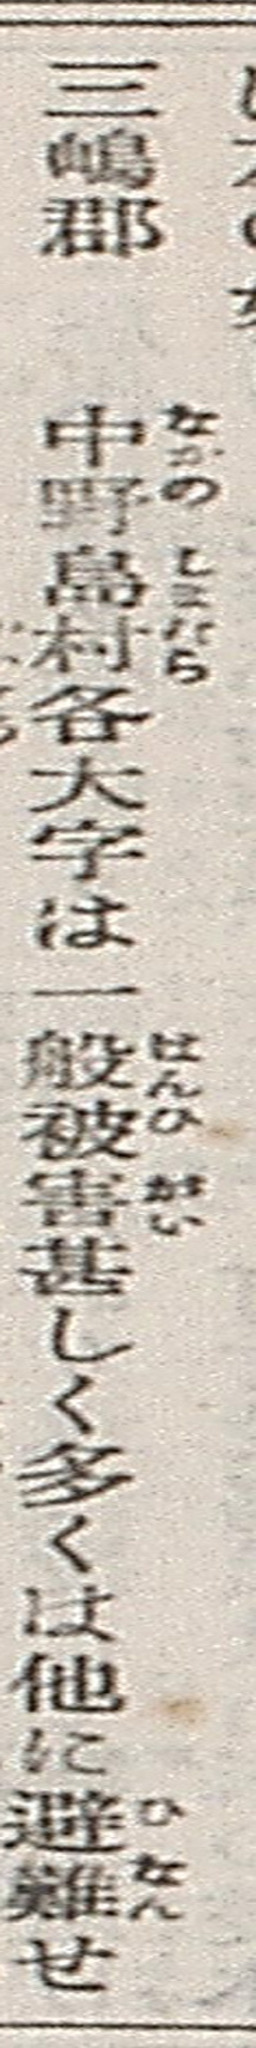三嶋郡中野島村各大字は一般被害甚しく多くは他に避難せ
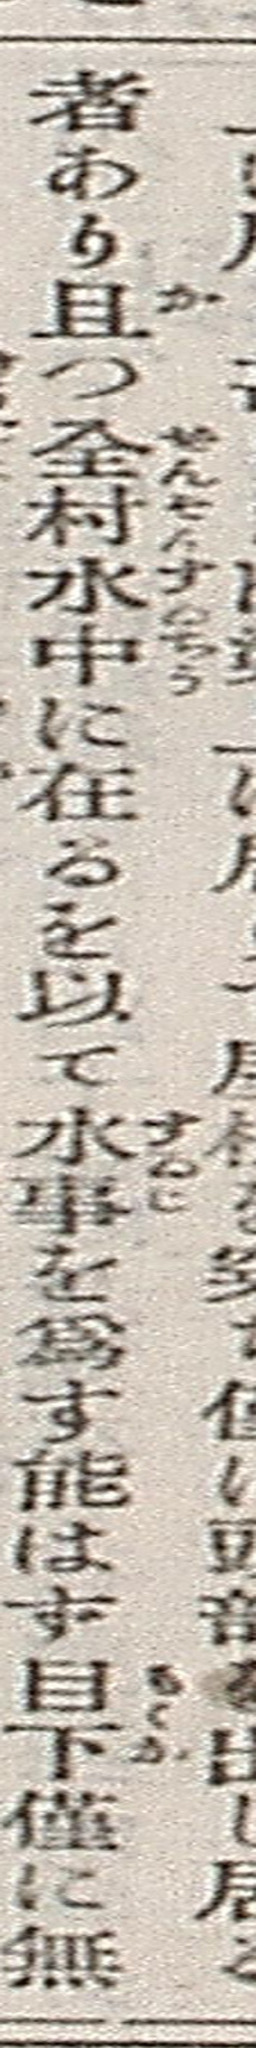者あり且つ全村水中に在るを以て水事を為す能はず目下僅に無
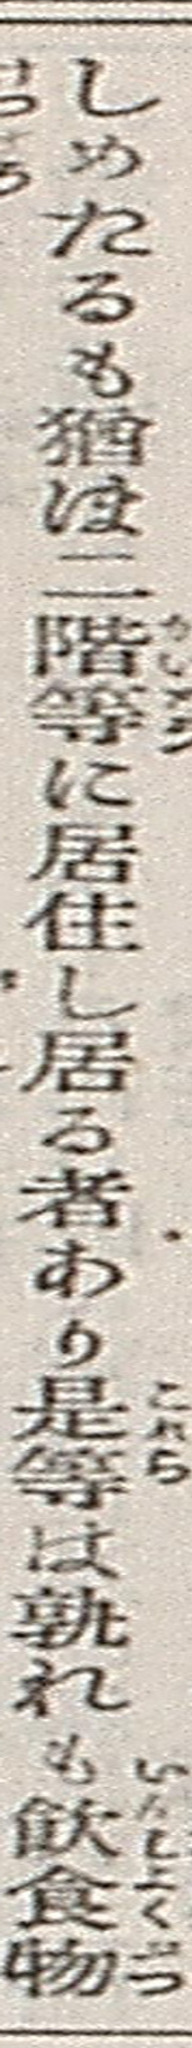しめたるも猶ほ二階等に住居し居る者あり是等は孰れも飲食物
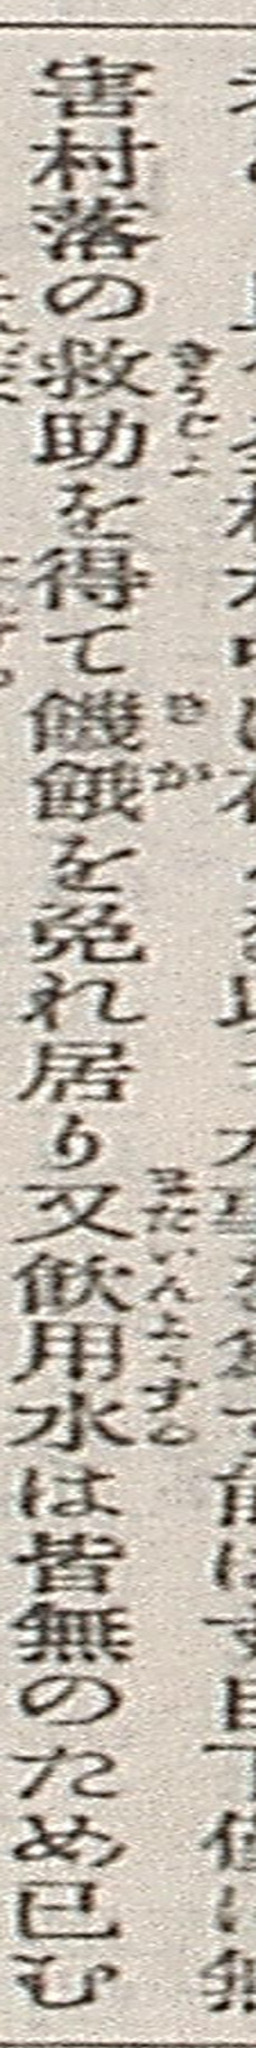害村落の救助を得て飢餓を免れ居り又飲用水は皆無のため已む
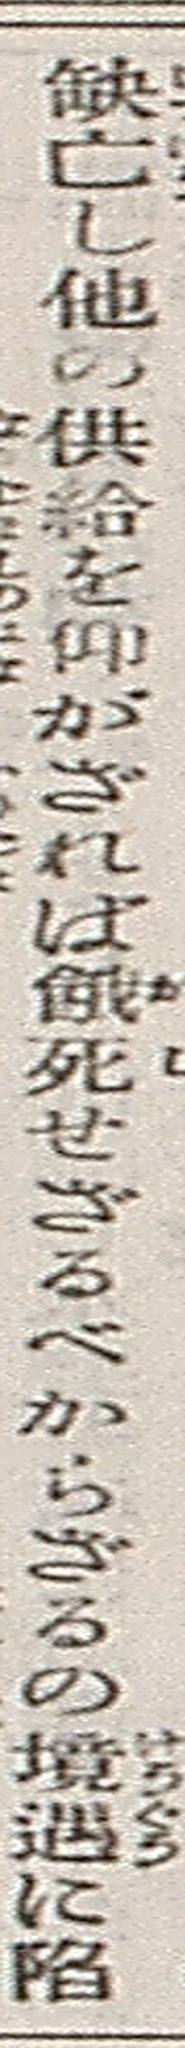缺亡し他の供給を仰がざれば餓死せざるべからざるの境遇に陥
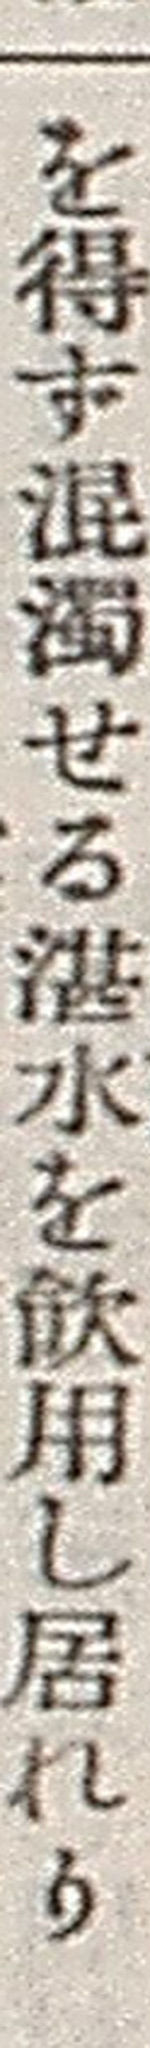を得ず混濁せる湛水を飲用し居れり
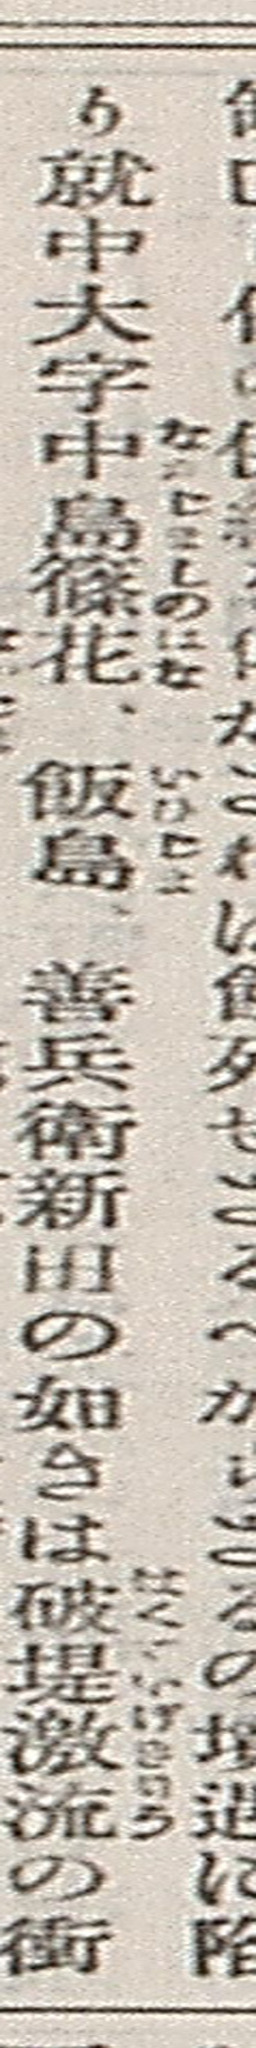り就中大字中島篠花、飯島、善兵衛新田の如きは破堤激流の衝
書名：風俗畫報臨時増刊第百二十八號　洪水被害録（下）
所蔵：東京大学地震研究所図書室 Earthquake Research Institute Library, The University of Tokyo, JAPAN
